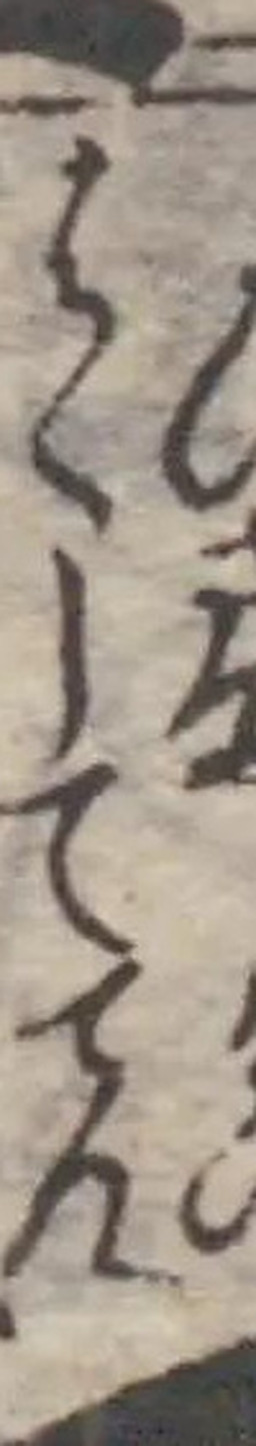はくしててん
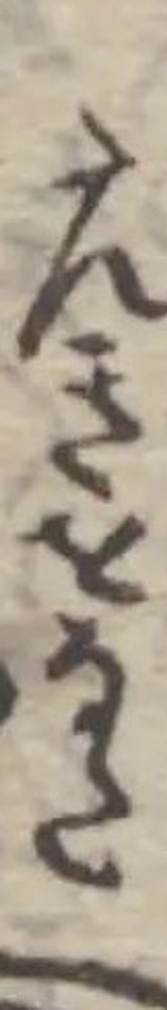たんきをなた
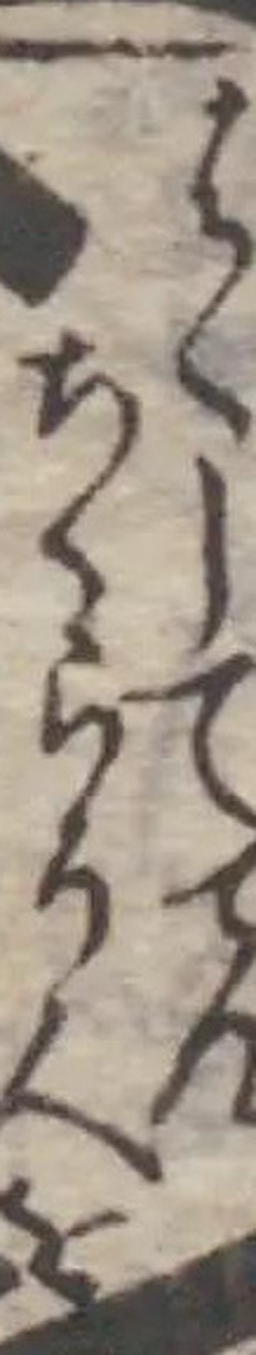ちくらう人を
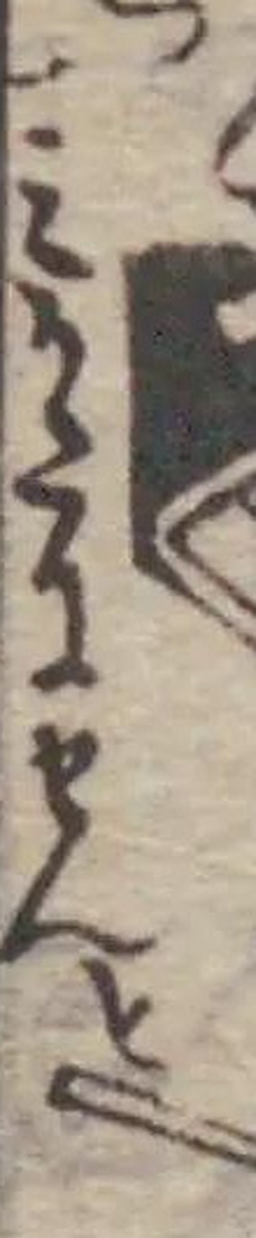みかたにせんと
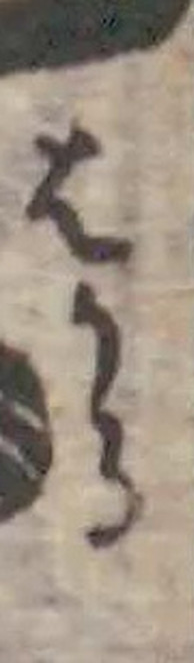はかる
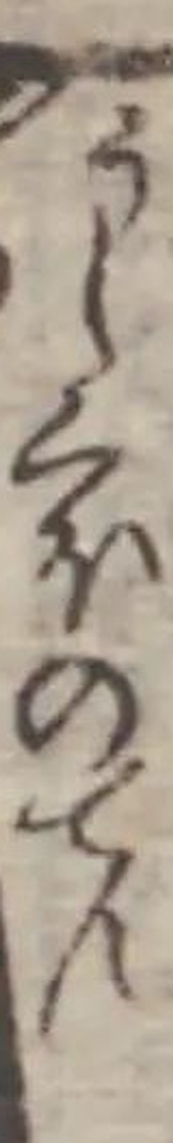うしくほのてん
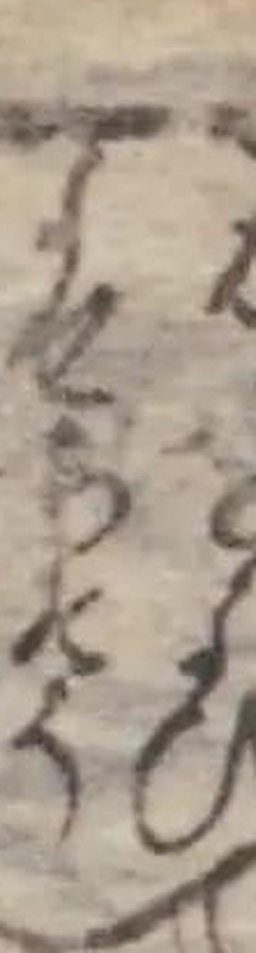よせちそう
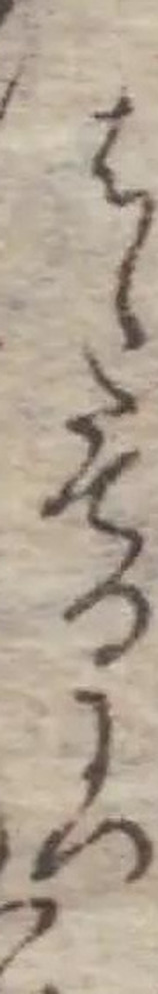はらたてるにつ
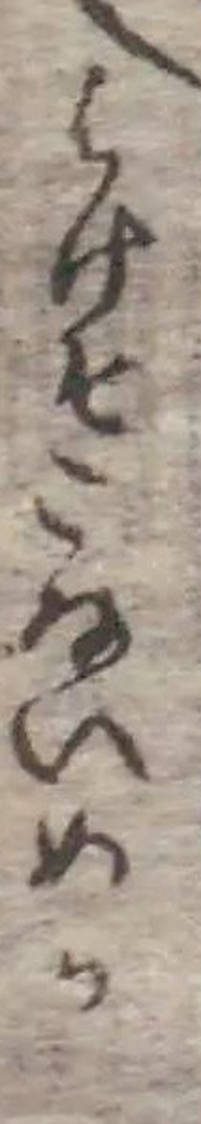ばけそこないめか

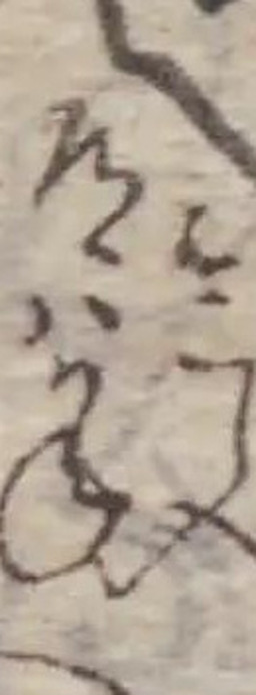道はかね
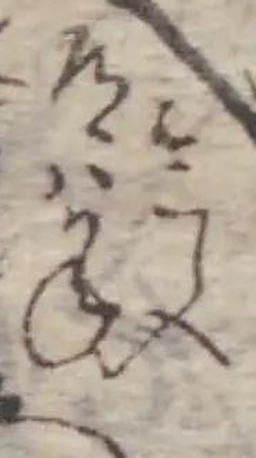道はかね
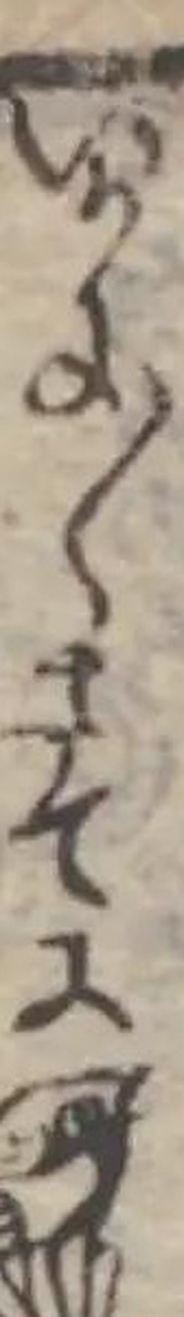いかに〳〵さてに
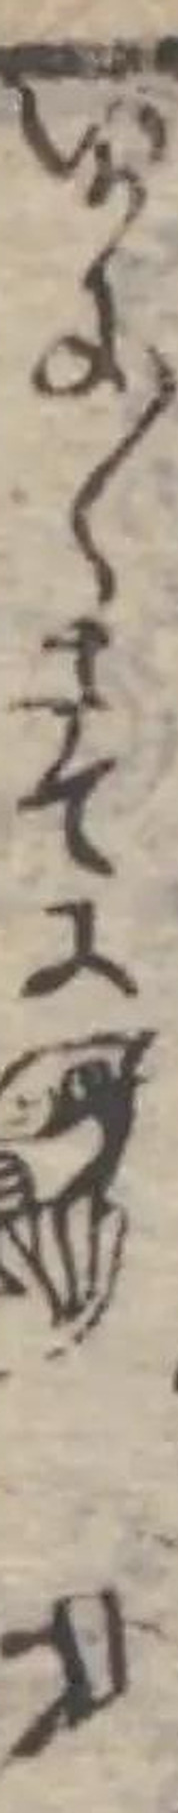いかに〳〵さてに
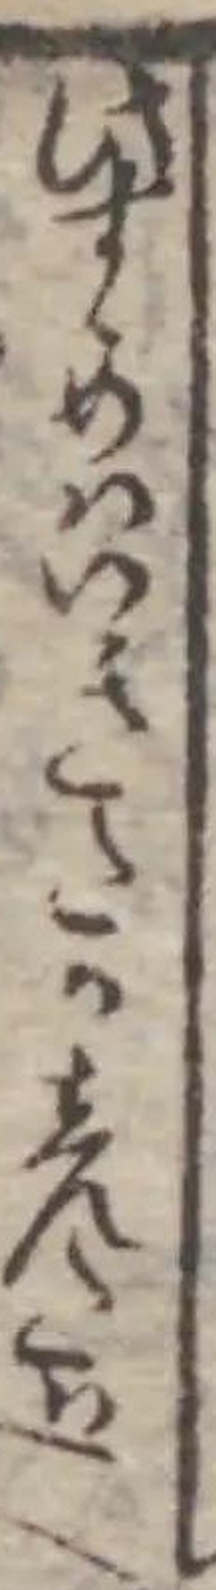此すゝめはいきたかしんたか
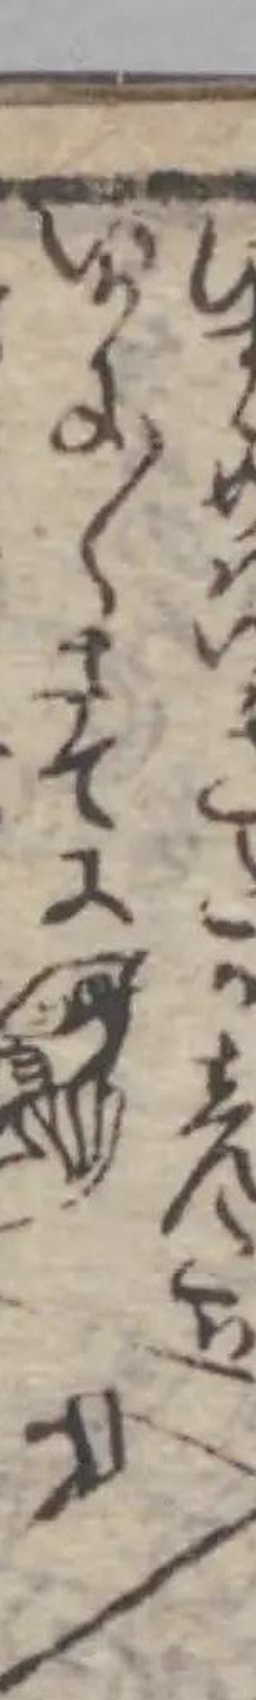いかに〳〵さてに
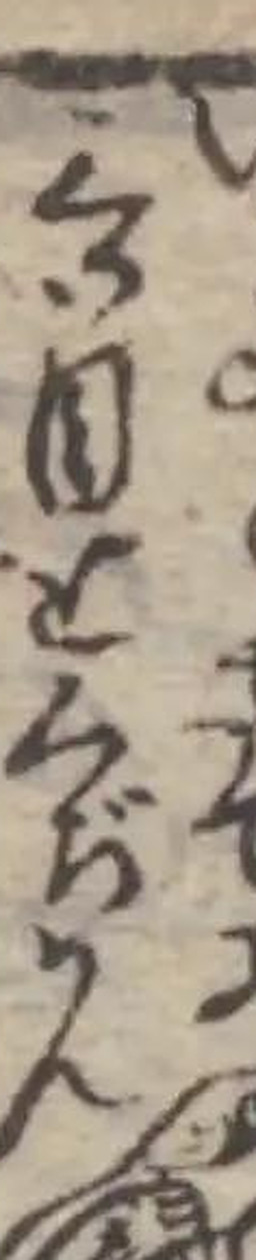三つ目をくぢかん
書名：化物三ツ目大ほうい 2巻
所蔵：国立国会図書館 National Diet Library, JAPAN
